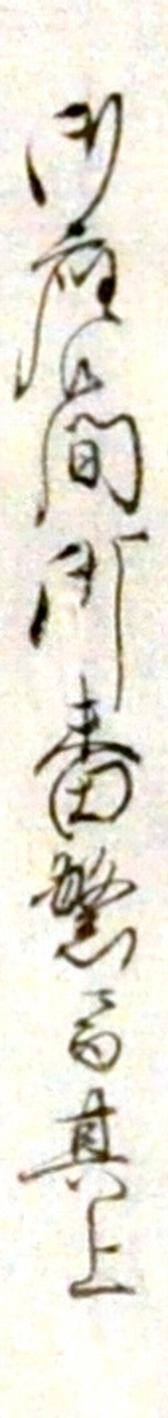御座候間御番繁ニ而其上
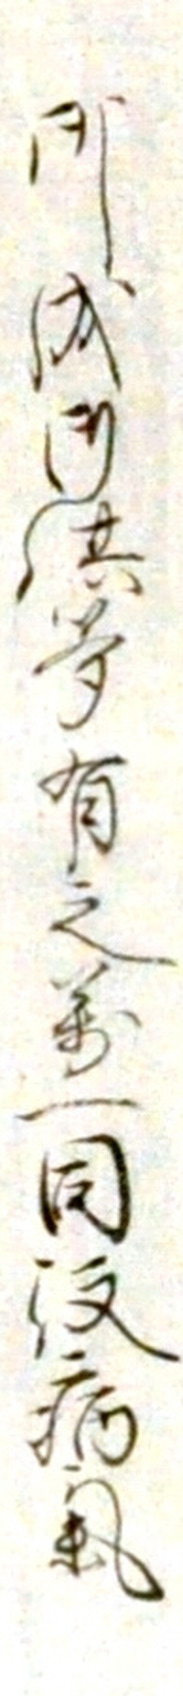御成御供等有之万一同役病気
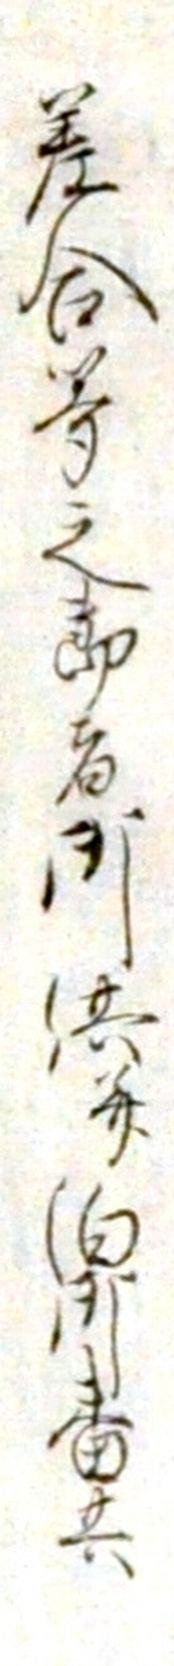差合等之節者御供并泊御番共
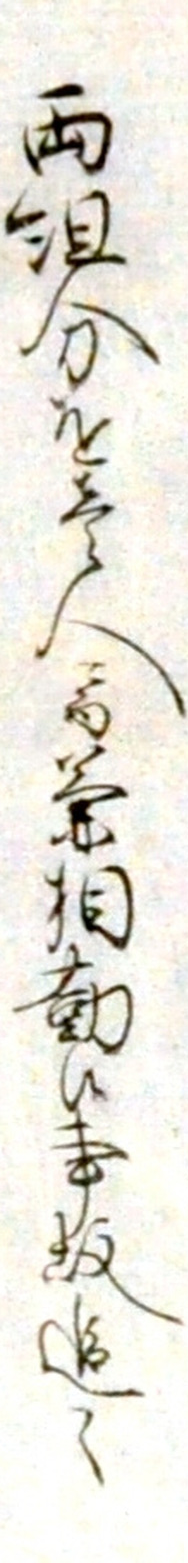両組分を壱人ニ而兼相勤候事故追々
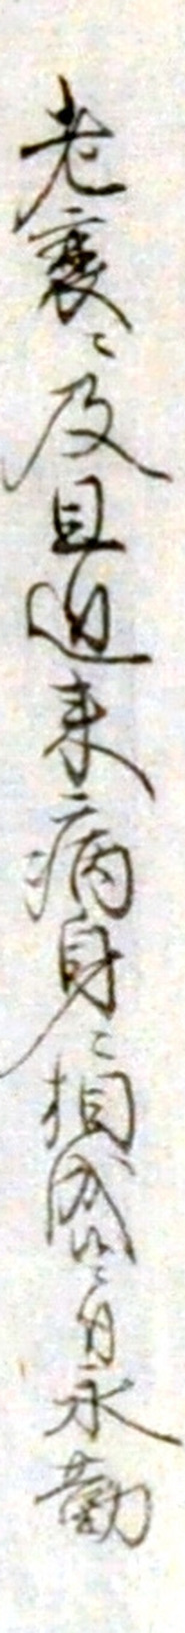老衰ニ及且近来病身ニ相成候ニ付永勤
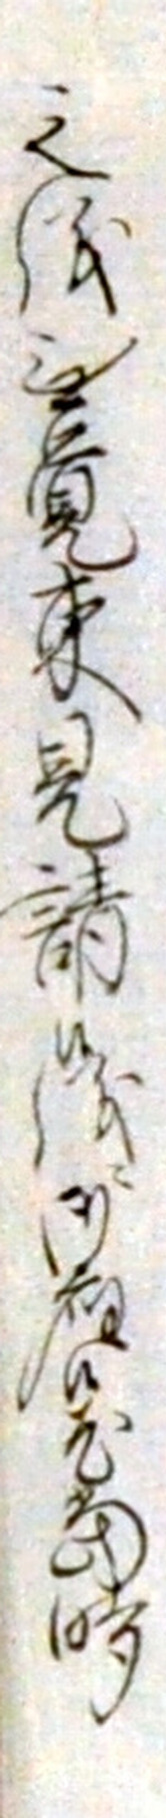之儀無覚束見請候儀ニ御座候尤当時

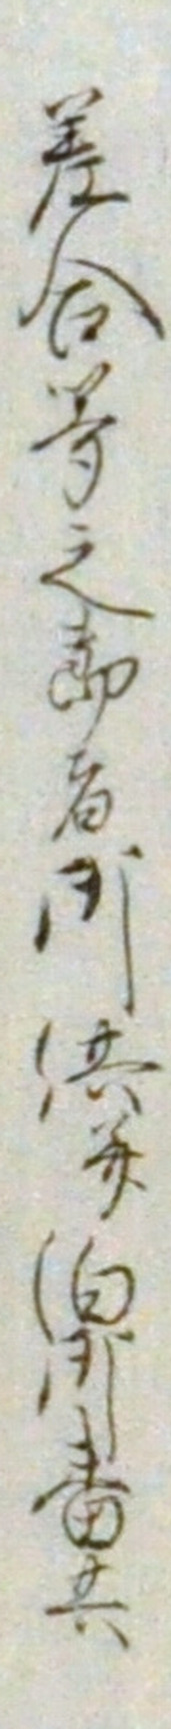差合等之節者御供并泊御番共
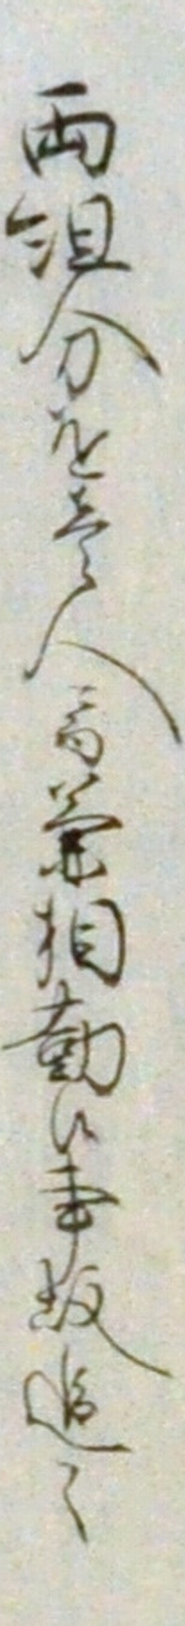両組分を壱人ニ而兼相勤候事故追々
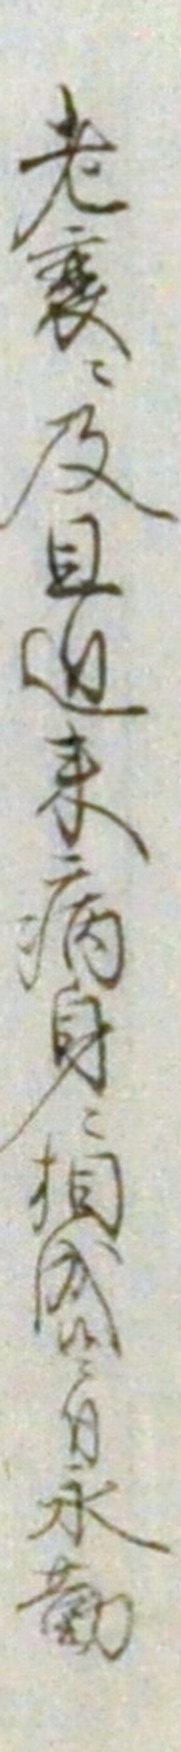老衰ニ及且近来病身ニ相成候ニ付永勤
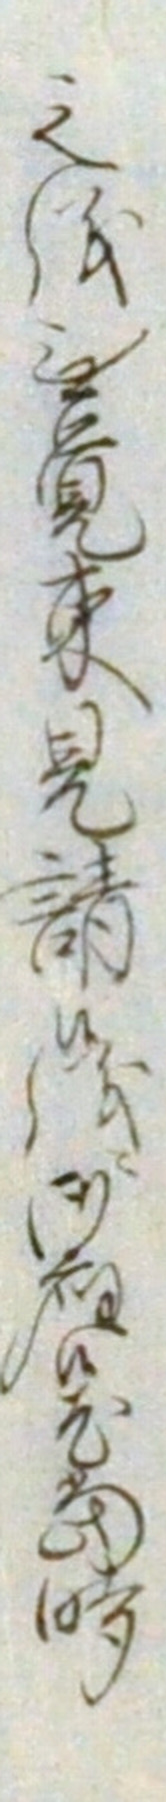之儀無覚束見請候儀ニ御座候尤当時
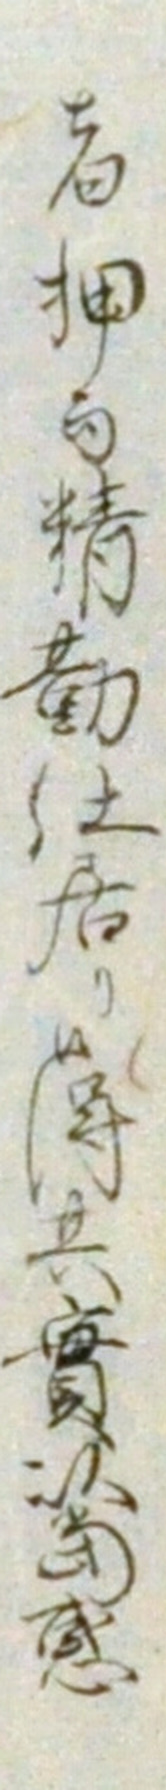者押向精勤仕居り候得共実以当惑
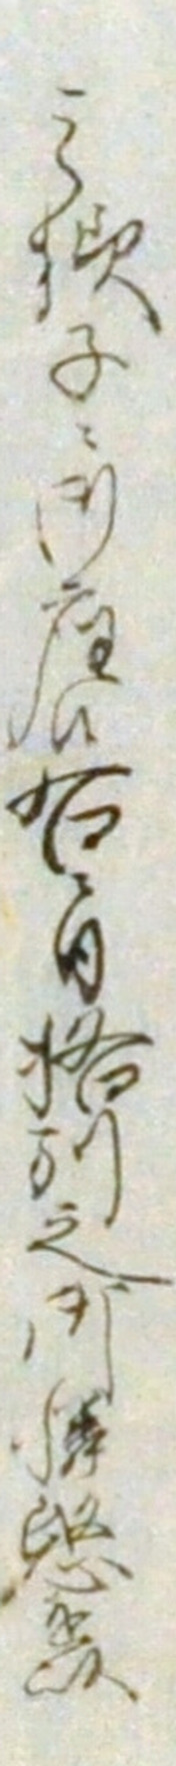之様子ニ御座候右ニ付格別之御憐愍を以
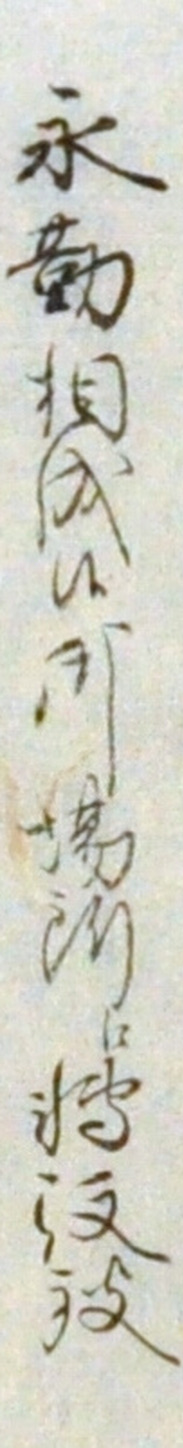永勤相成候御場所江転役致
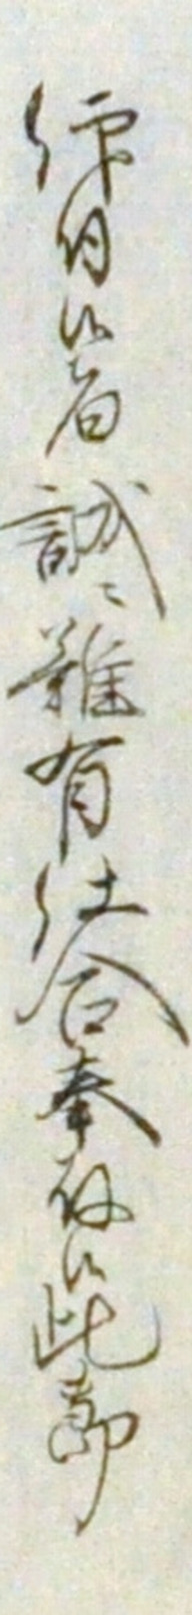仰付候者誠ニ難有仕合奉存候此節
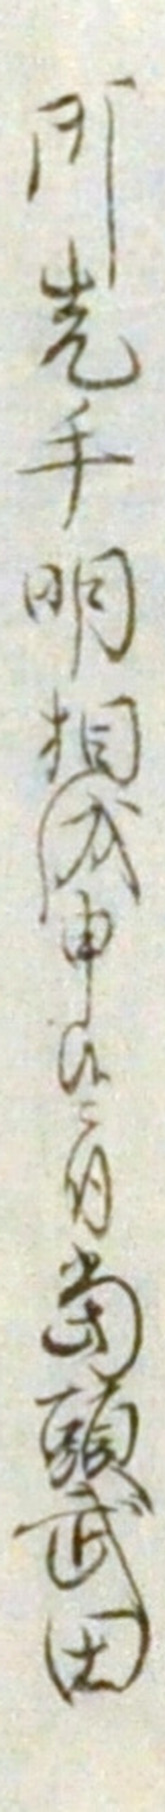御先手明相成申候ニ付当頭武田
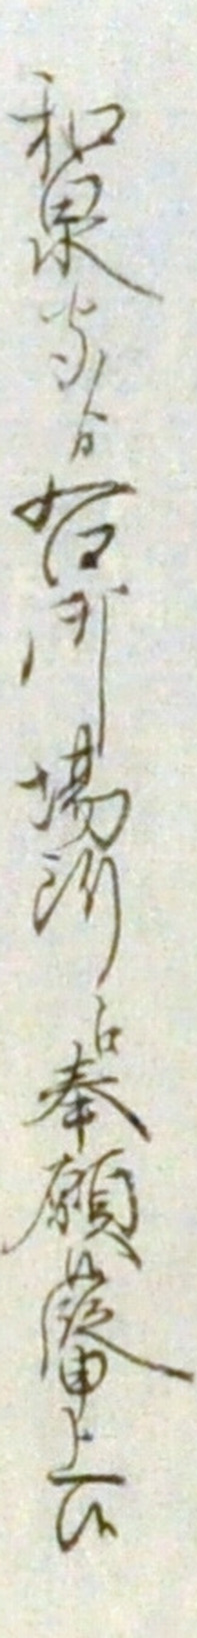和泉守ゟ右御場所江奉願候段申上候
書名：若年寄御役中之御書物〔一括〕
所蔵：伊那市立高遠町図書館・合同会社AMANE
